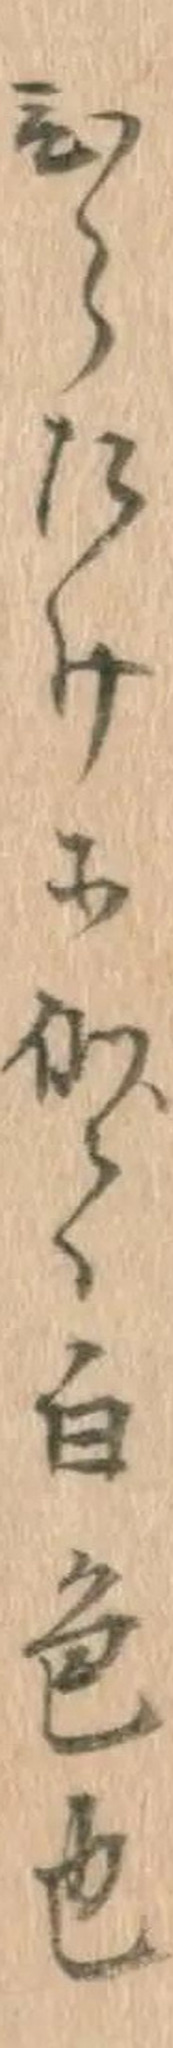ひらたけに似て白色也
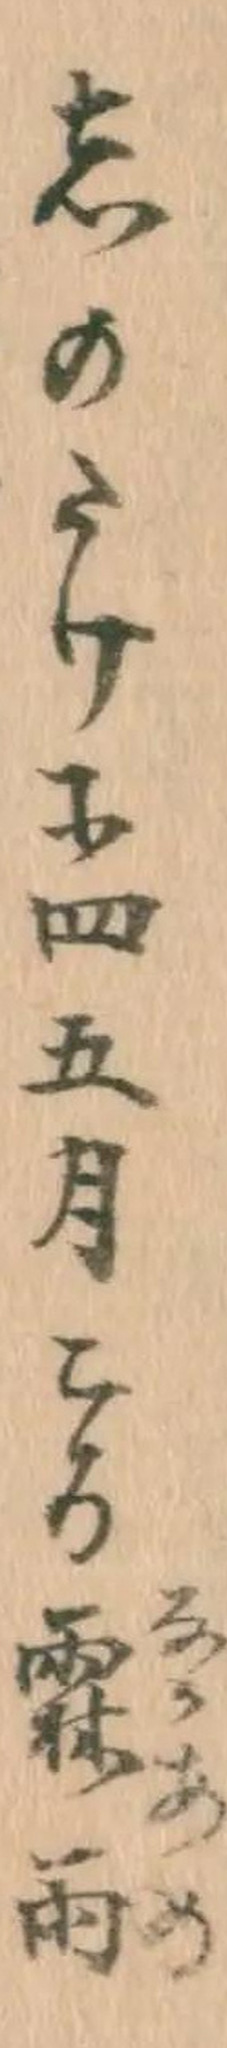しのたけに四五月ころ霖雨
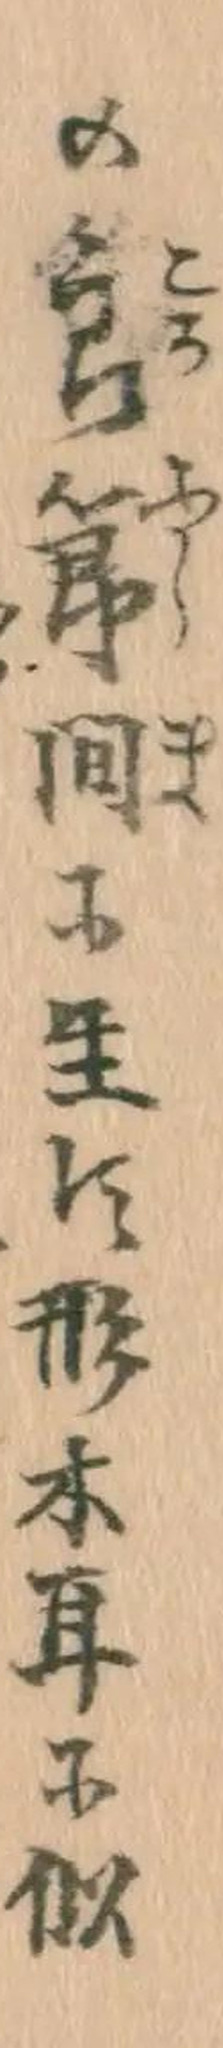の節節間に生す形木耳に似
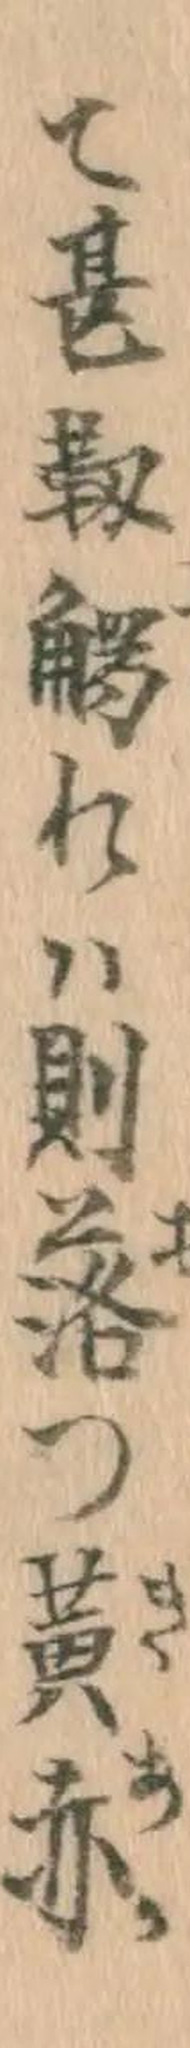て甚靭触れは則落つ黄赤
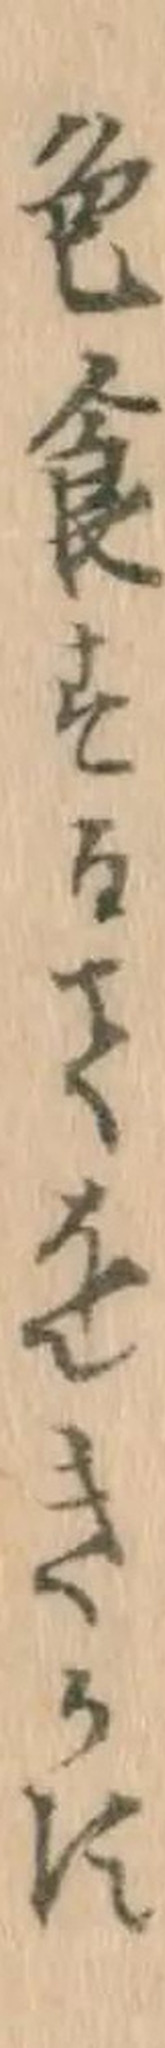色食することをきかす

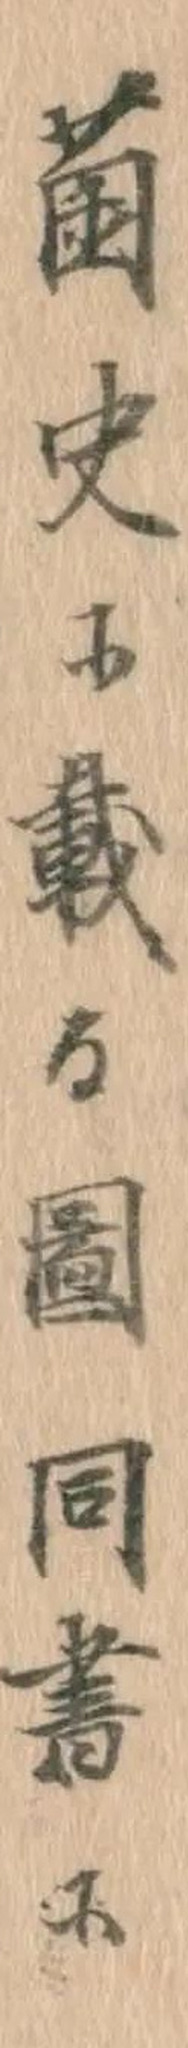菌史に載る図同書に
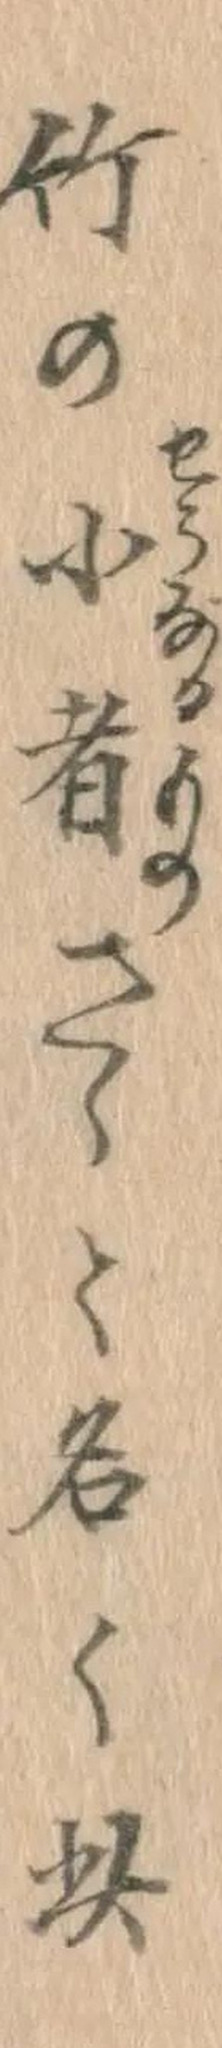竹の小者さゝと名く此
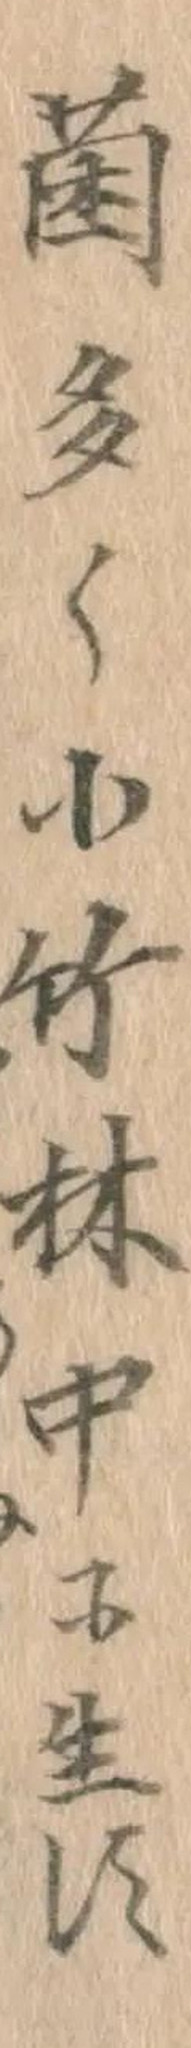菌多く小竹林中に生す
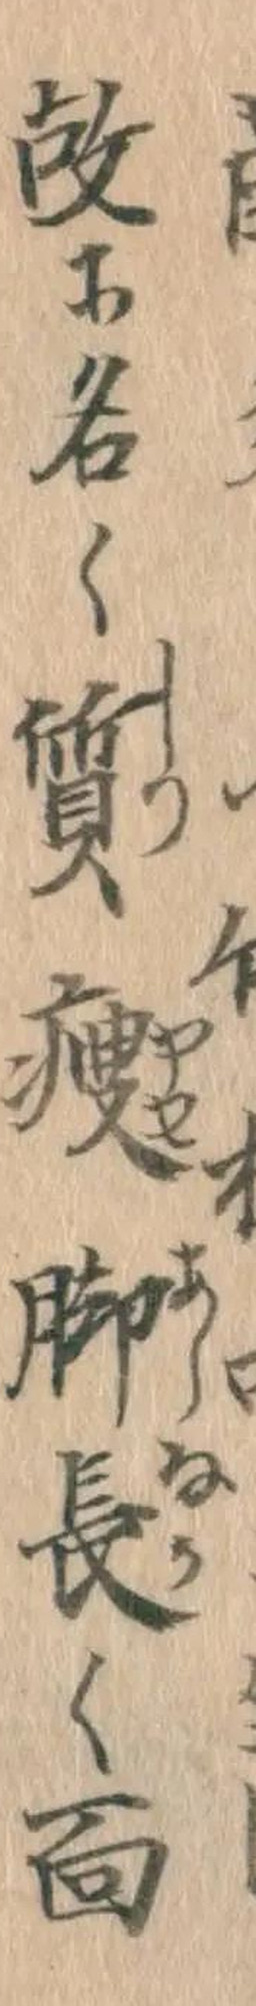故に名く質痩脚長く面
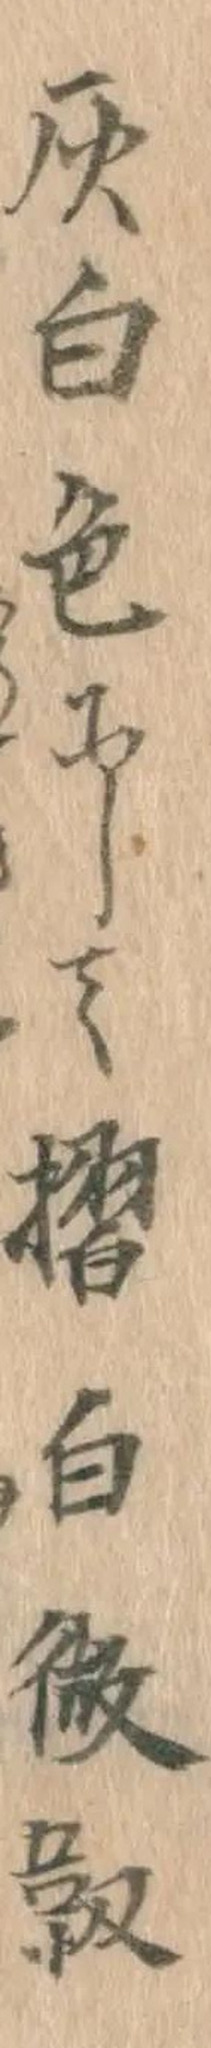灰白色にして摺白微韌
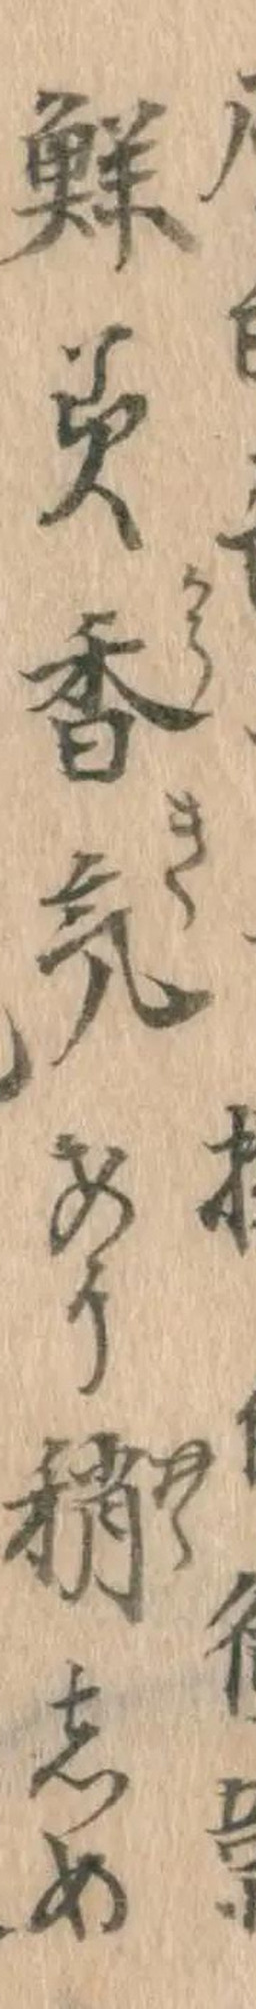鮮美香気あり稍しめ
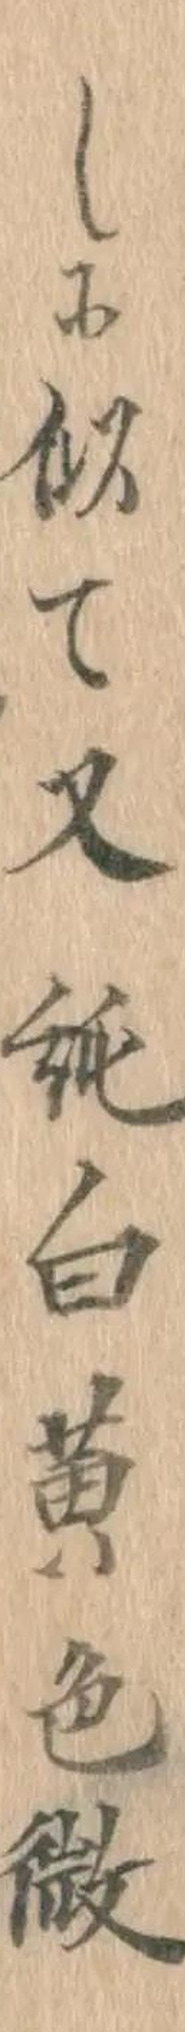しに似て又純白黄色微
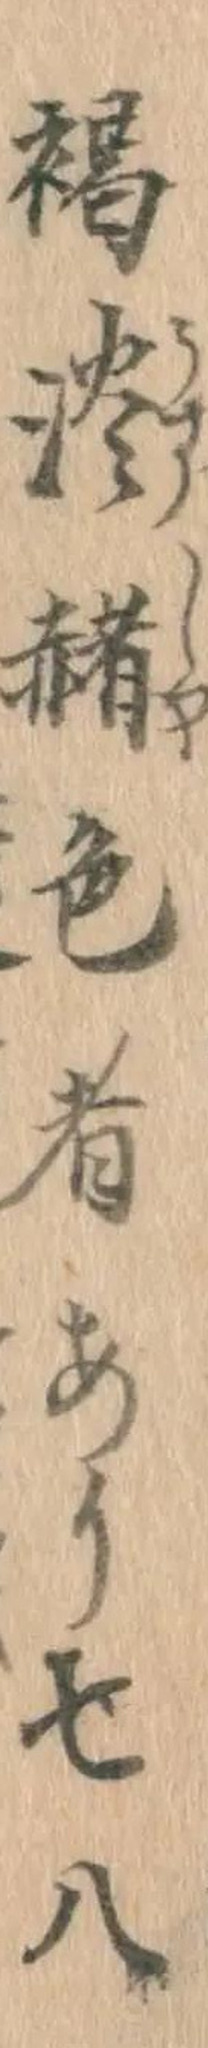褐淡赭色者あり七八
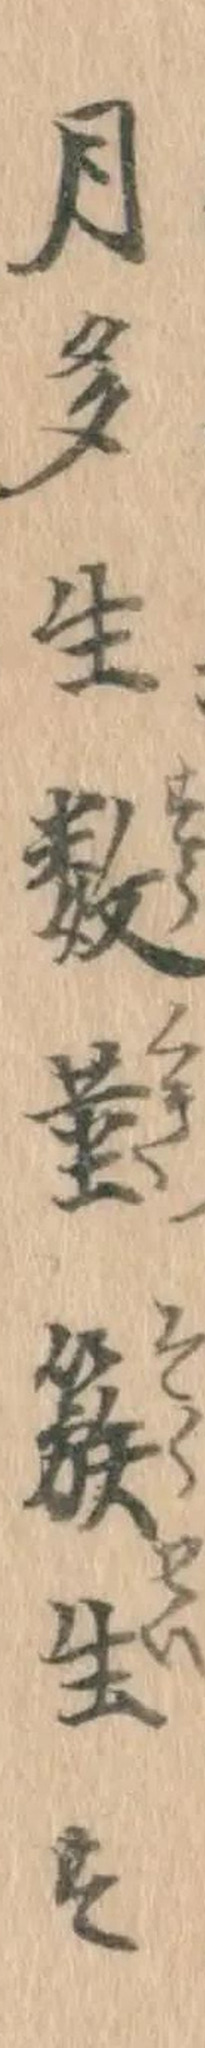月多生数茎簇生す
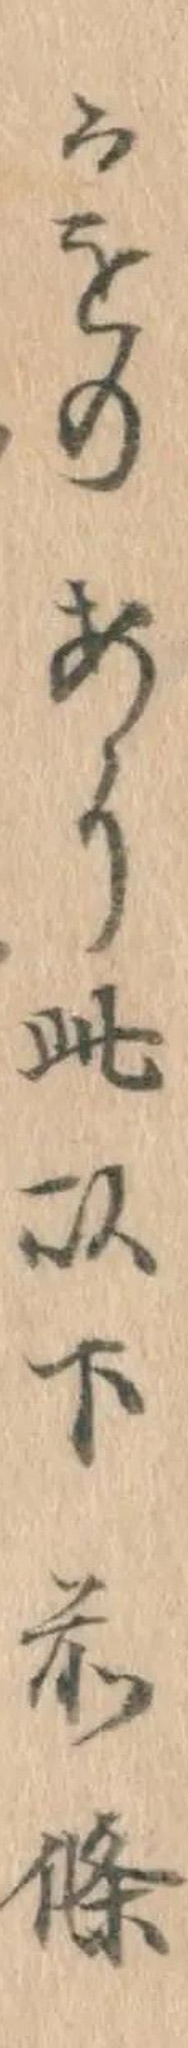るものあり此以下前条
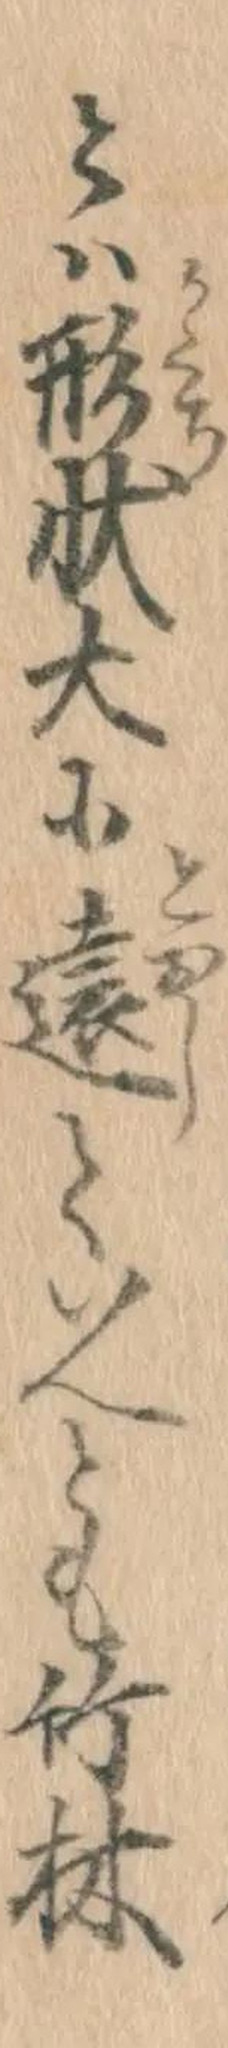とは形状大に遠といへとも竹林
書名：本草図譜. 巻58-60
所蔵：国立国会図書館 National Diet Library, JAPAN
